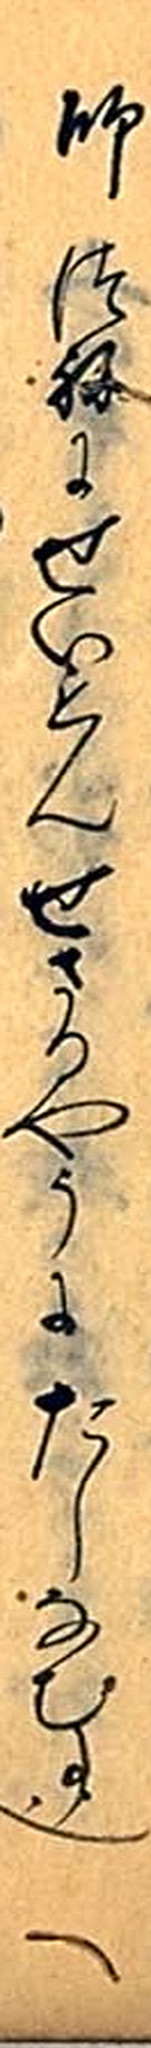師つねにせいもんせさるやうにたしなむ事也
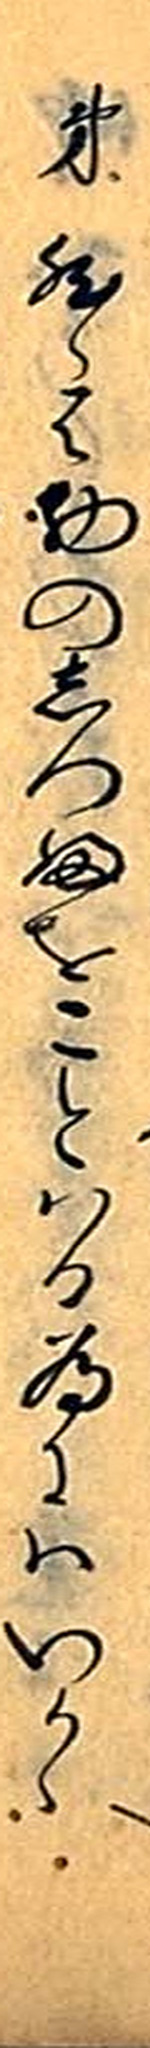弟然らは物のしつふをことはる為にはいかゝ
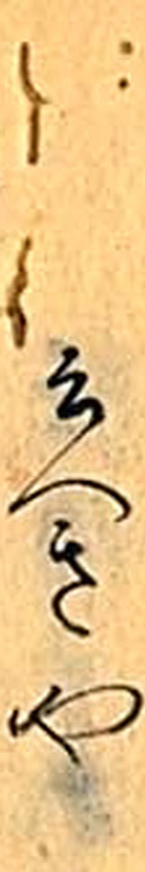云へきや
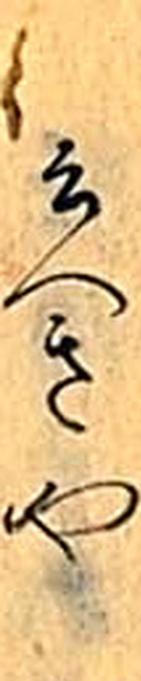云へきや
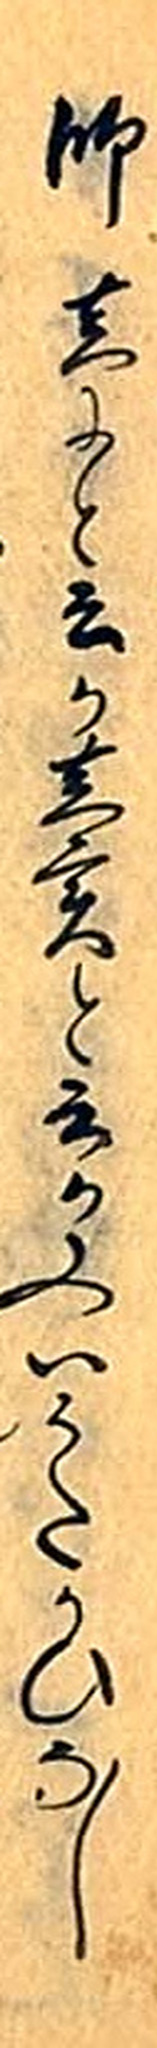師真にと云か真実と云か又はうたかひなし
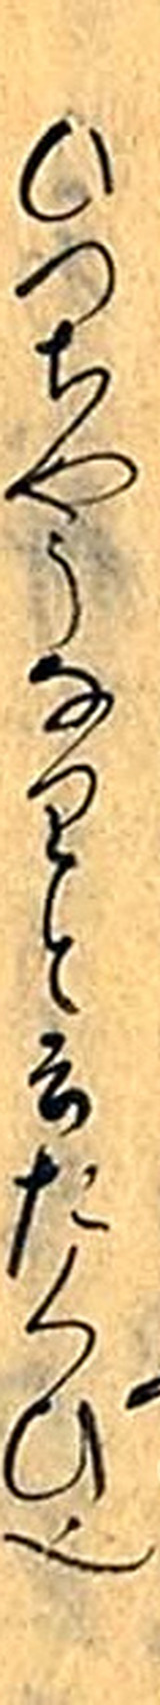ひつちやうなりと云たくひ也
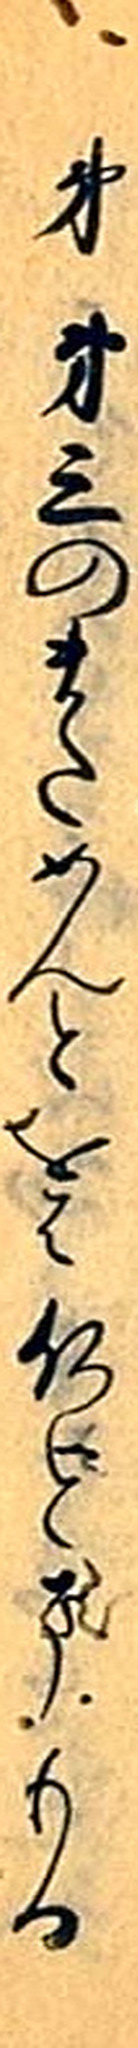弟第三のまためんとをは何とまもる
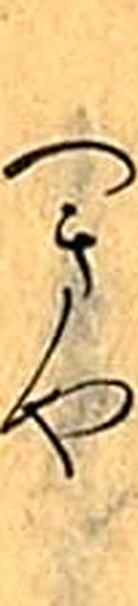へきや
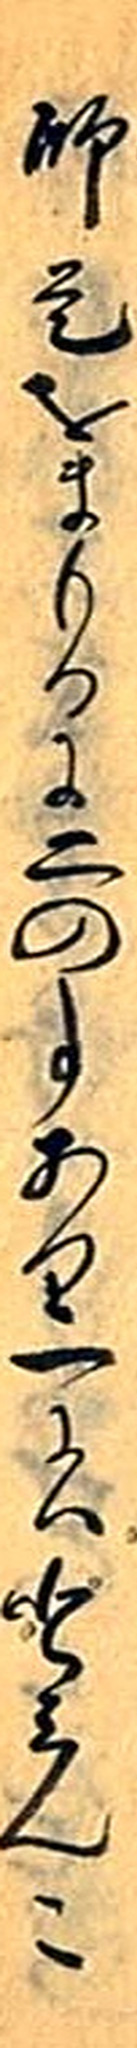師是をまもるに二の事あり一にはとみんこ
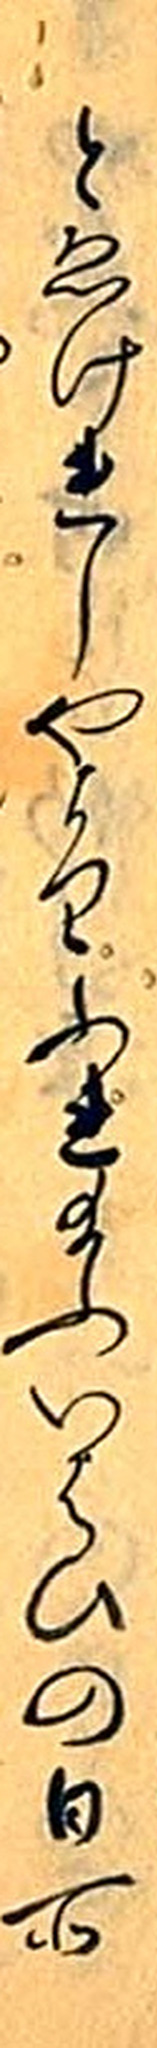とゑけれしやよりふれ給ふいはひの日所
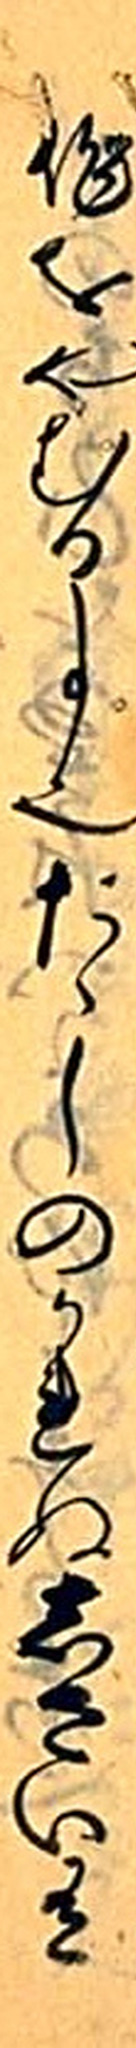作をやむる事也たゝしのかれぬしさい有
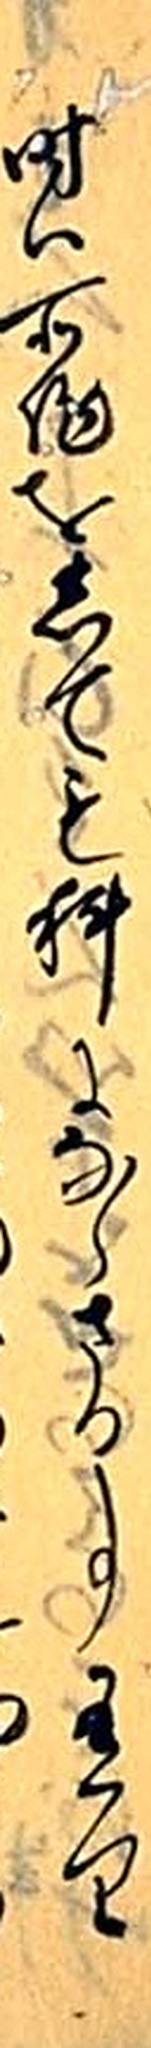時は所作をしても科にならさる事有り
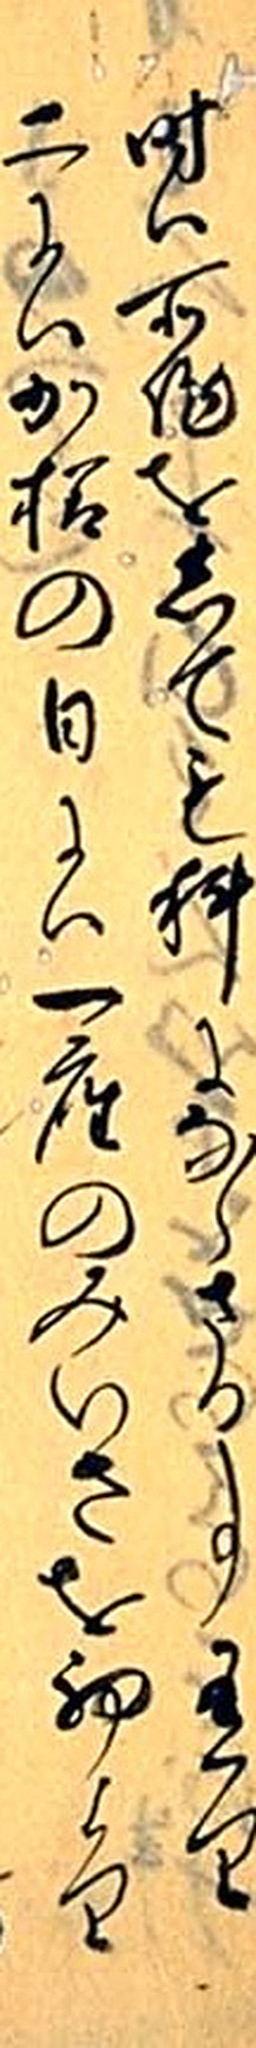二にはか様の日には一座のみいさを初より
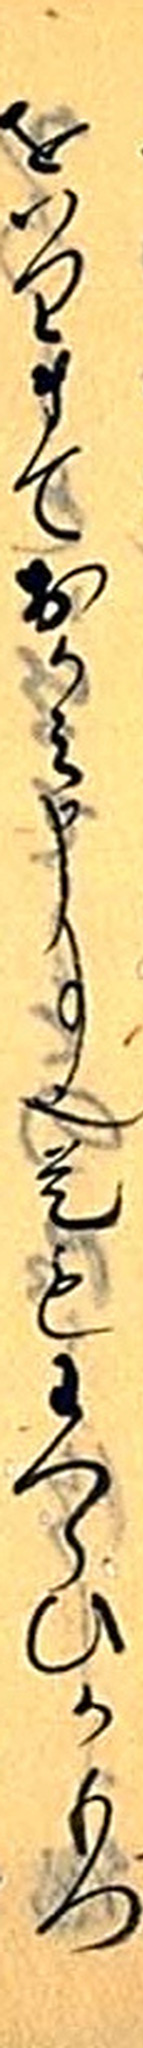をはりまておかみ申事也是もわつらひかもつ
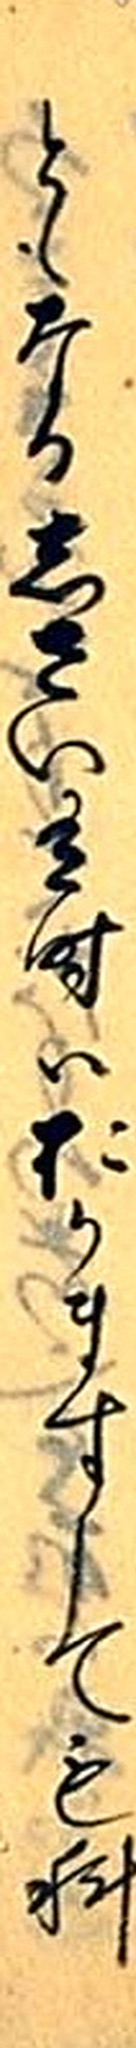ともなるしさい有時はおかますしても科
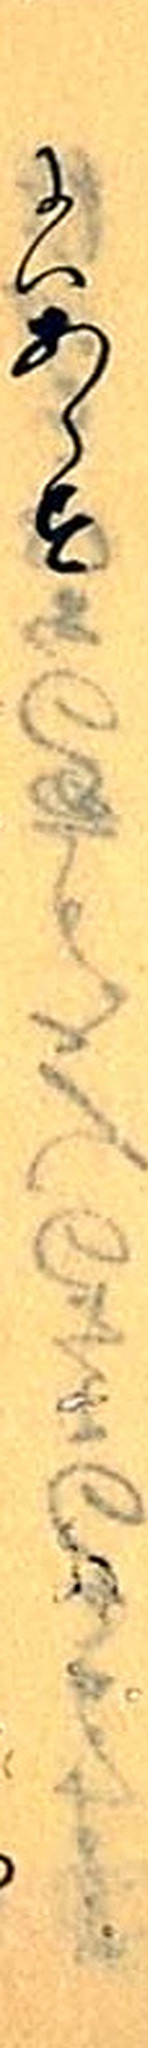にはあらす
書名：ドチリナ・キリシタン
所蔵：東京大学総合図書館 / General Library in the University of Tokyo
